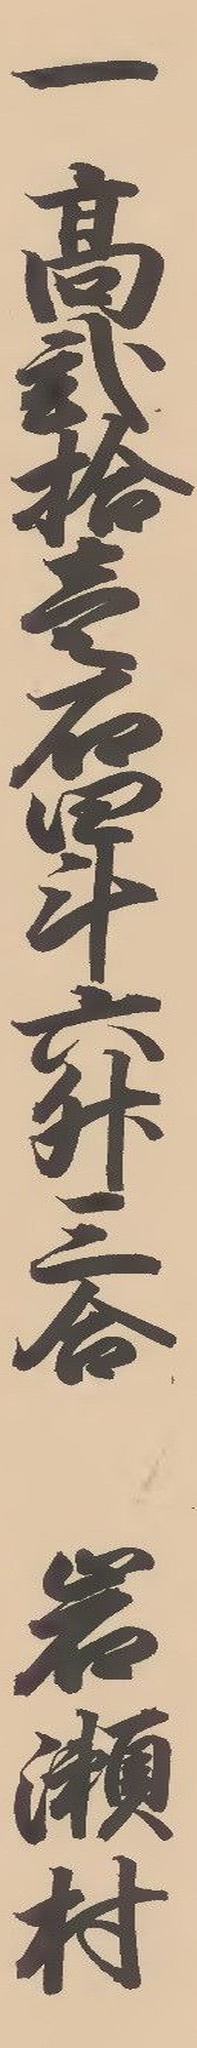一高弐拾壱石四斗六升三合岩瀬村
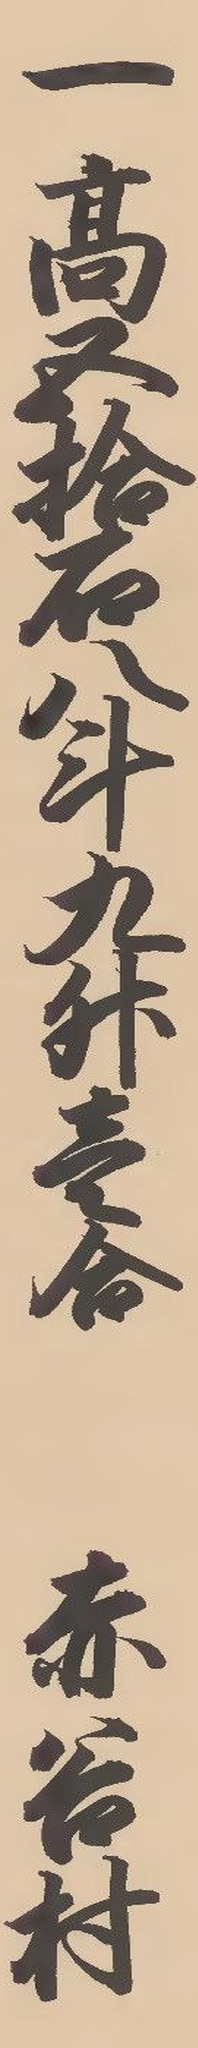一高五拾石八斗九升壱合赤谷村
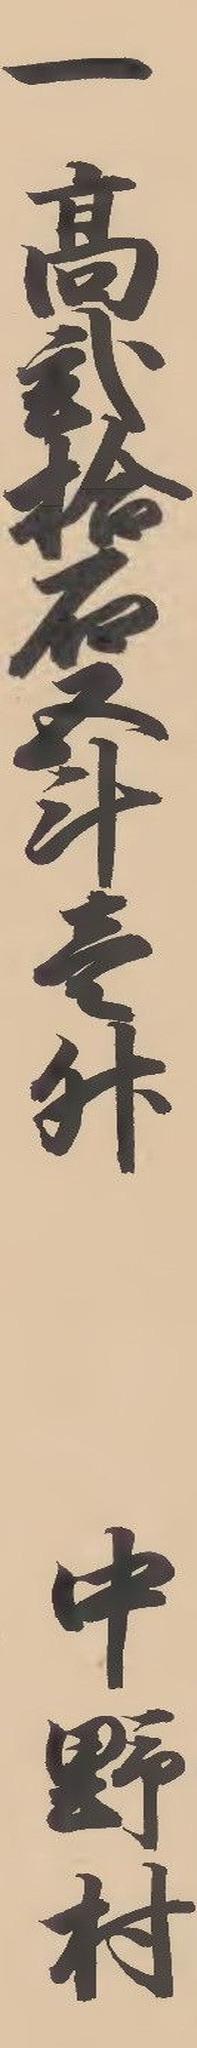一高弐拾石五斗壱升中野村
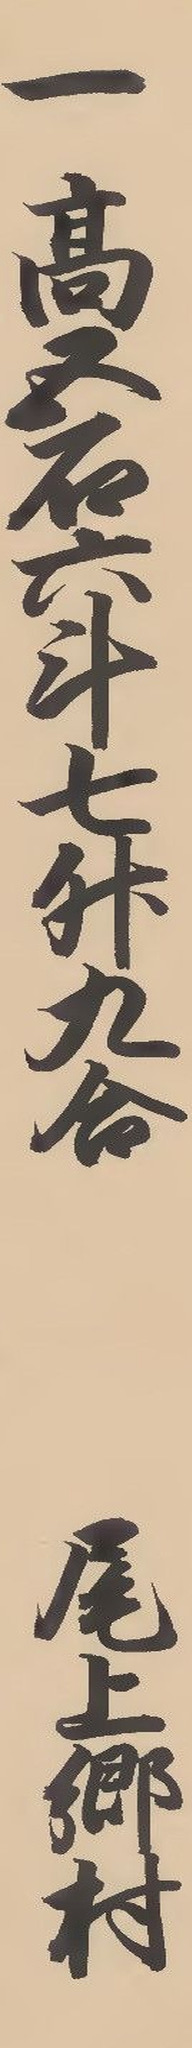一高五石六斗七升九合尾上郷村
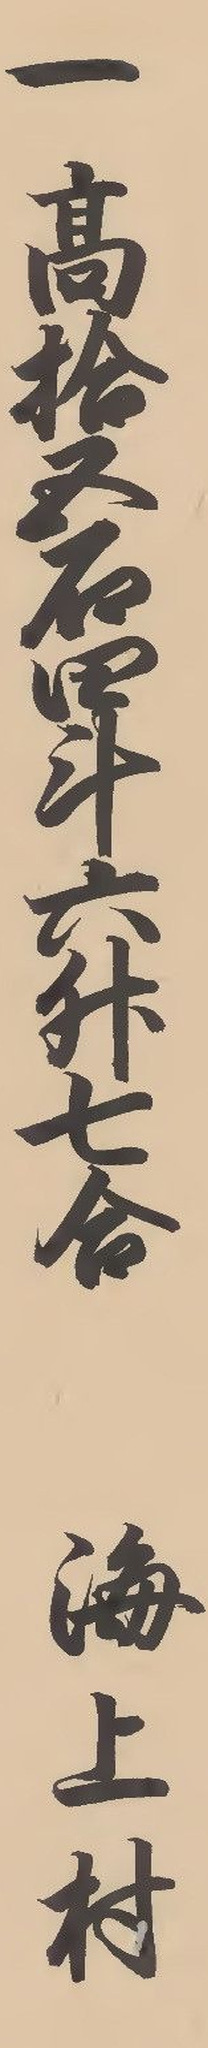一高拾五石四斗六升七合海上村
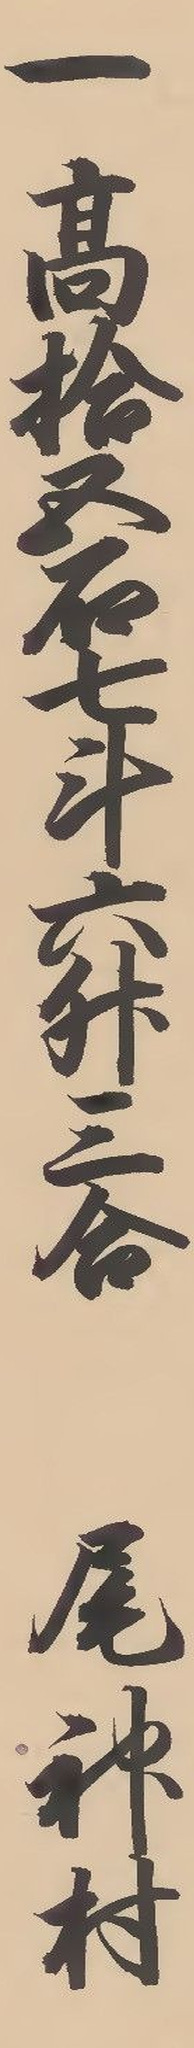一高拾五石七斗六升三合尾神村

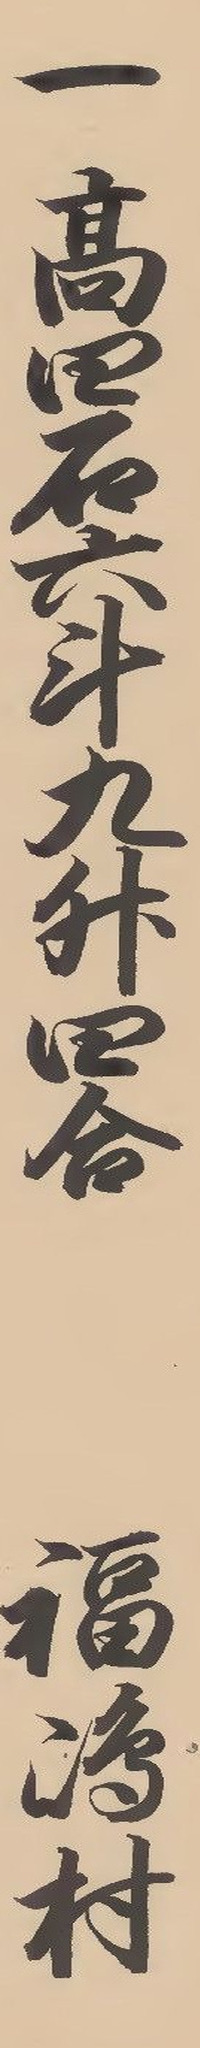一高四石六斗九升四合福島村
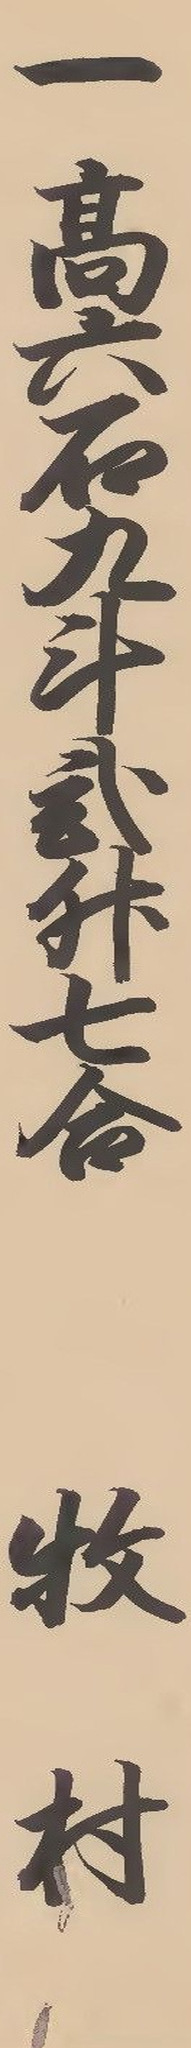一高六石九斗弐升七合牧村
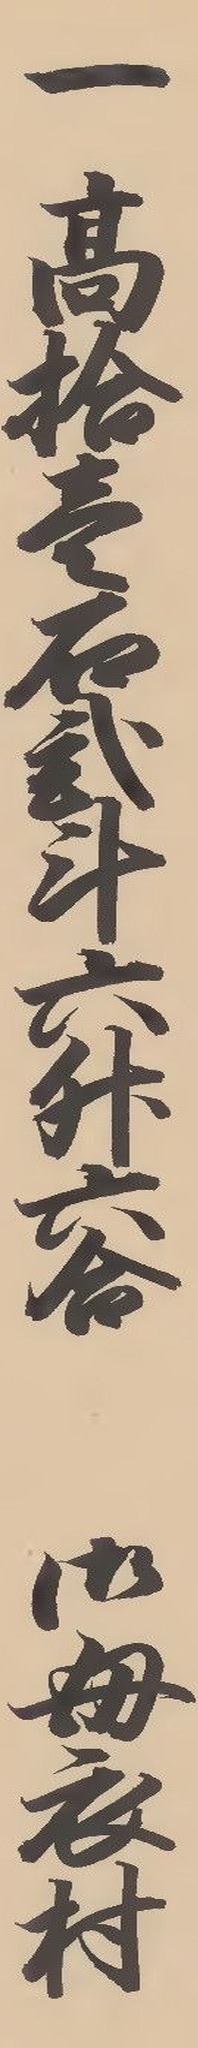一高拾壱石弐斗六升六合御母衣村
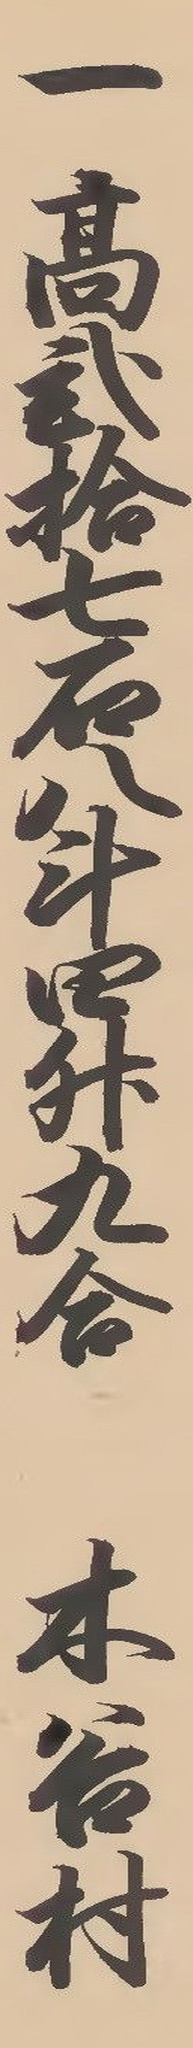一高弐拾七石八斗四升九合木谷村
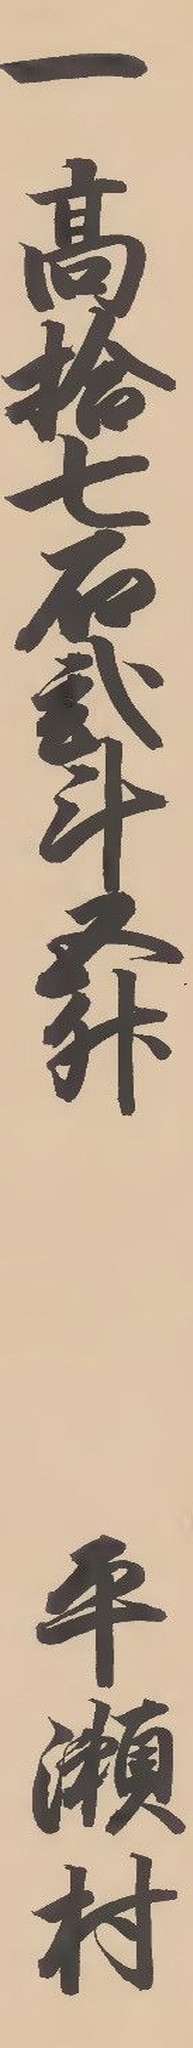一高拾七石弐斗五升平瀬村
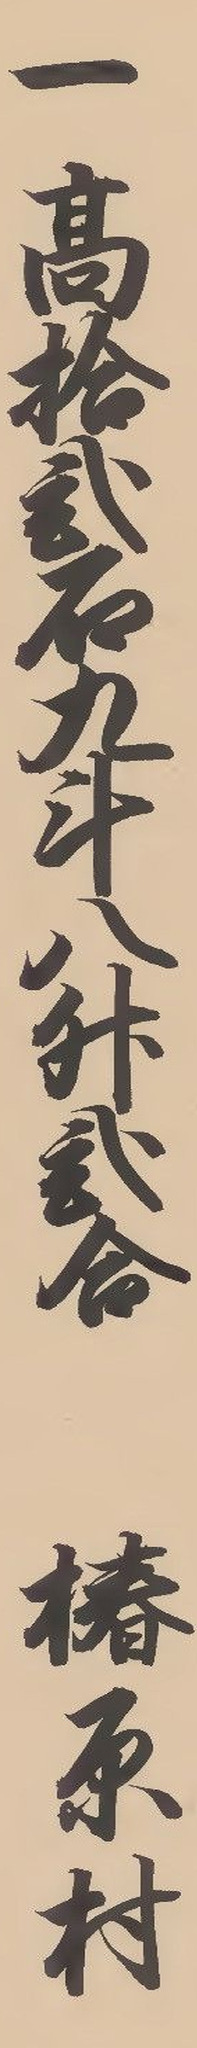一高拾弐石九斗八升弐合椿原村
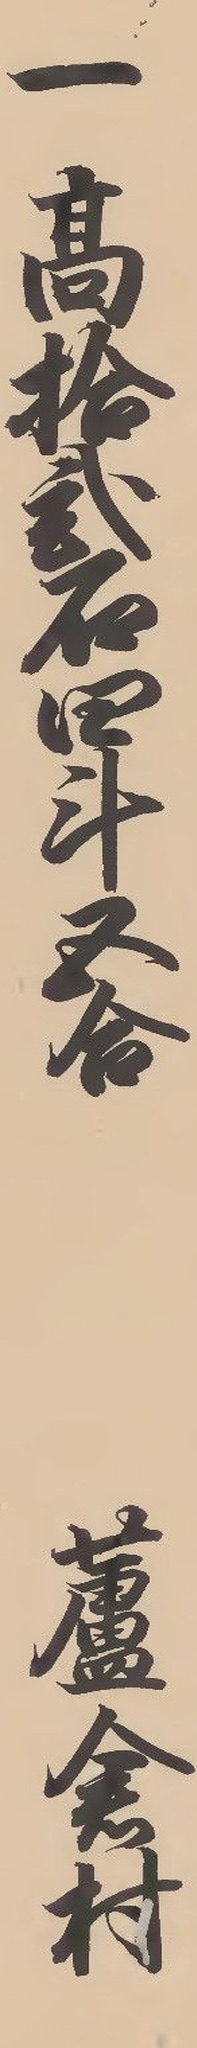一高拾弐石四斗五合蘆倉村
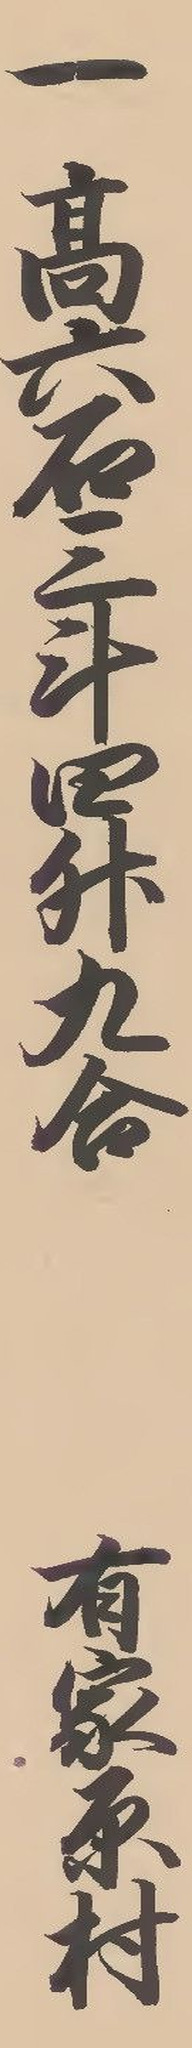一高六石三斗四升九合有家原村

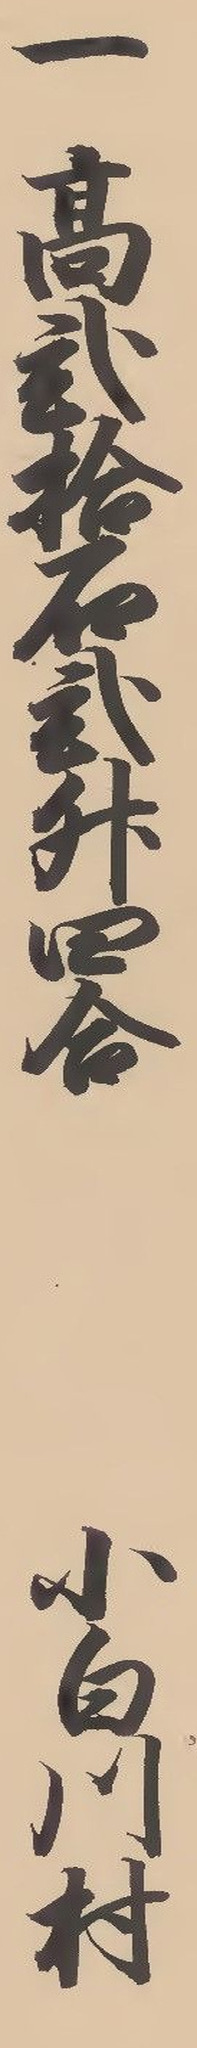一高弐拾石弐升四合小白川村
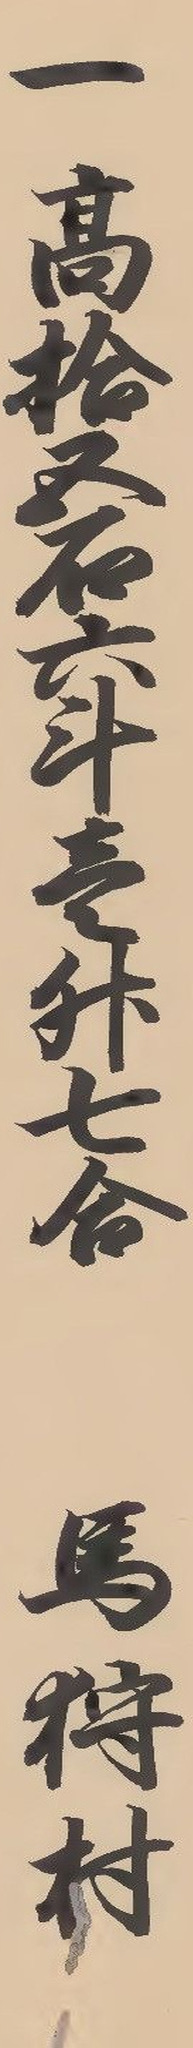一高拾五石六斗壱升七合馬狩村
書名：飛騨国郷帳
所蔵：国立公文書館 National Archives of Japan
